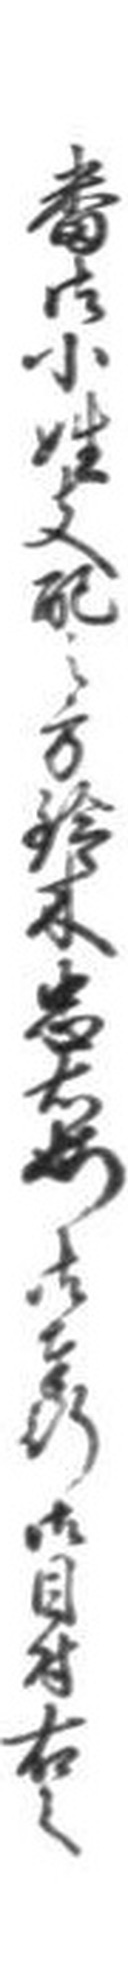番御小姓支配之方鈴木忠右衛門御奉行御目付右之

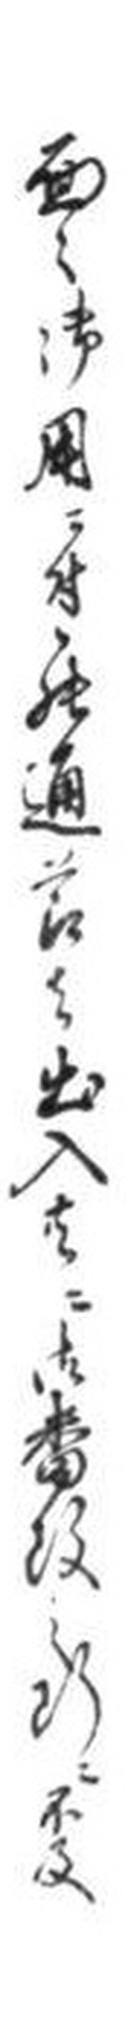面々御用ニ付罷通節者出入共ニ御番改之断ニ不及
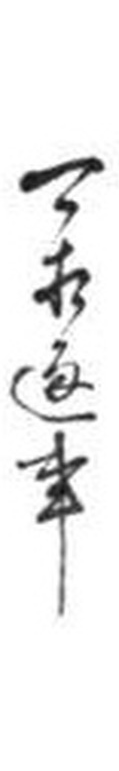可相通事
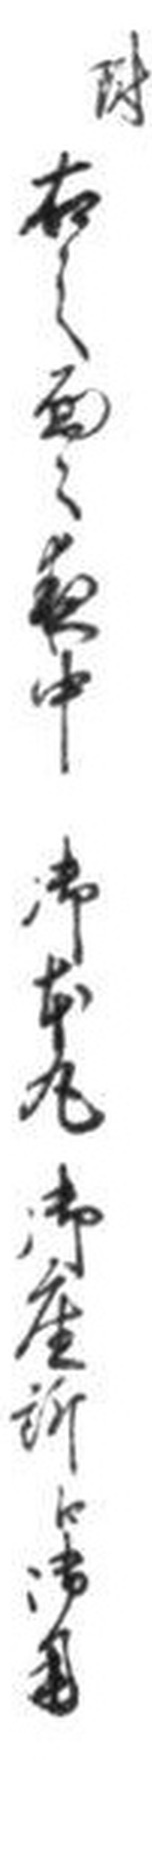右之面々夜中御本丸御座所江御用
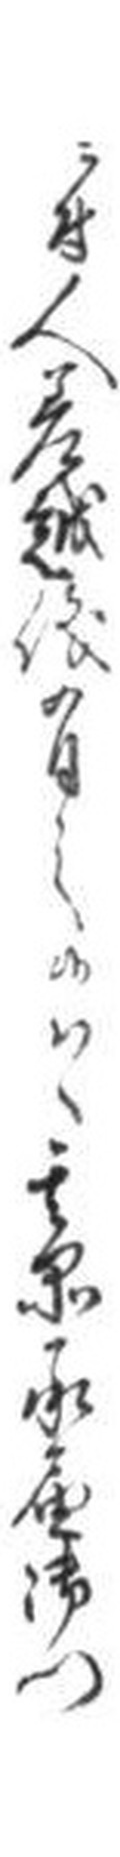ニ付人差越儀有之候ハヽ其品承届御門
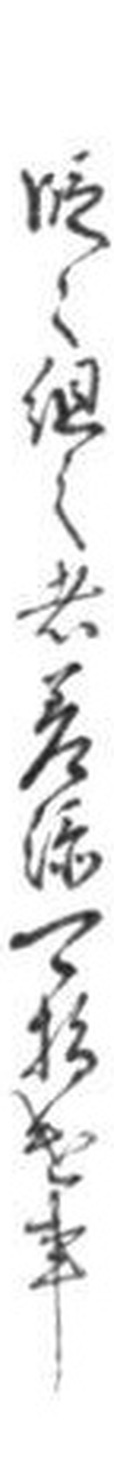段々組之者差添可指遣事
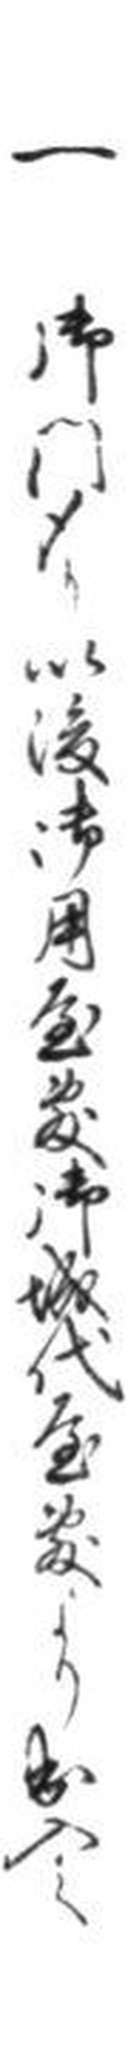一御門〆り以後御用屋敷御城代屋敷より出入之
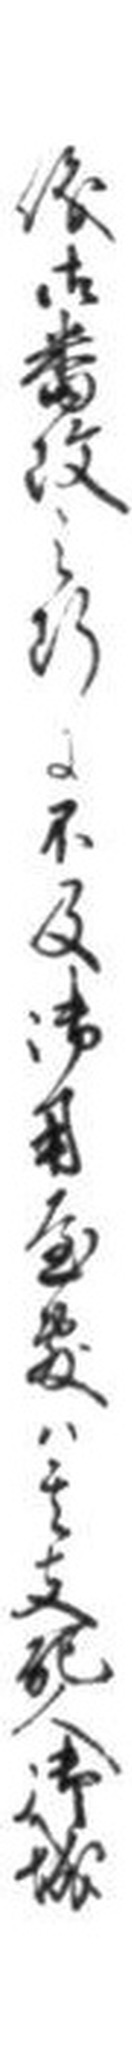儀御番改之断に不及御用屋敷ハ其支配人御城
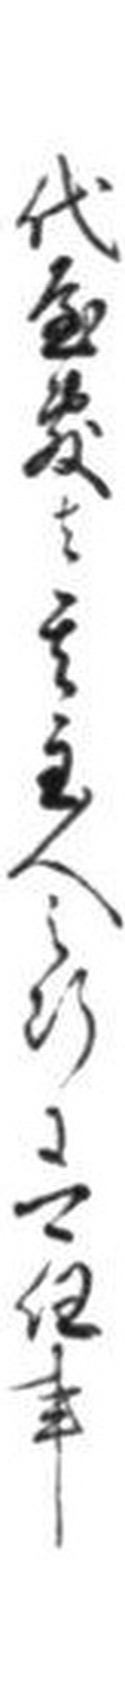代屋敷者其主人之断に可任事
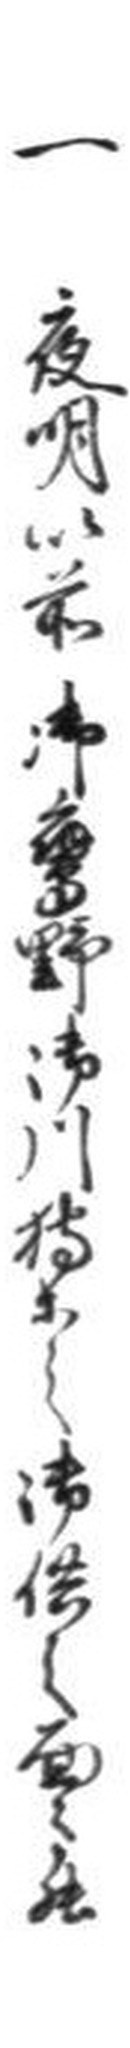一夜明以前御鷹野御川狩等之御供之面々罷
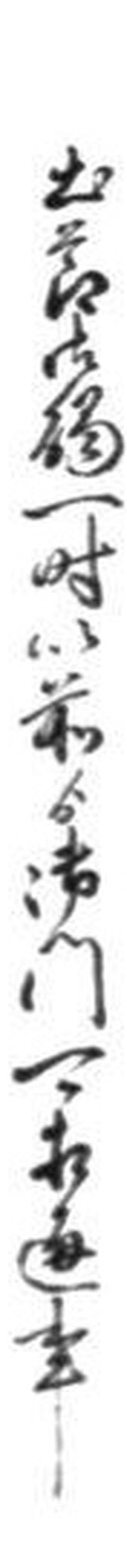出節御触一時以前ゟ御門可相通事
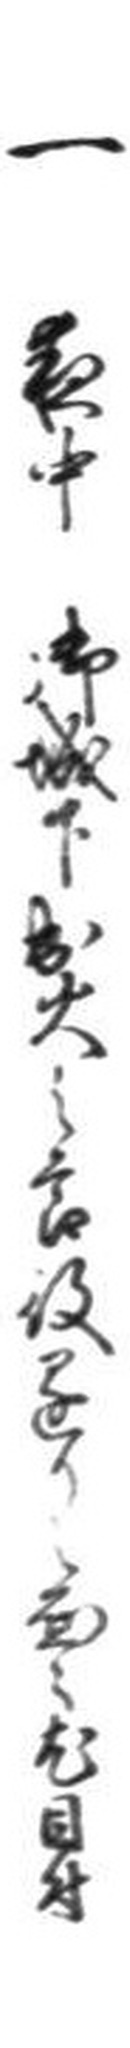一夜中御城下出火之節役懸り之面々尤目付
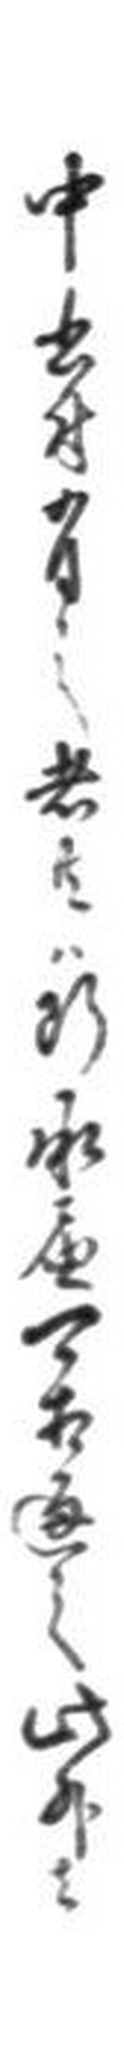中書付有之者共ハ断承届可相通之此外者
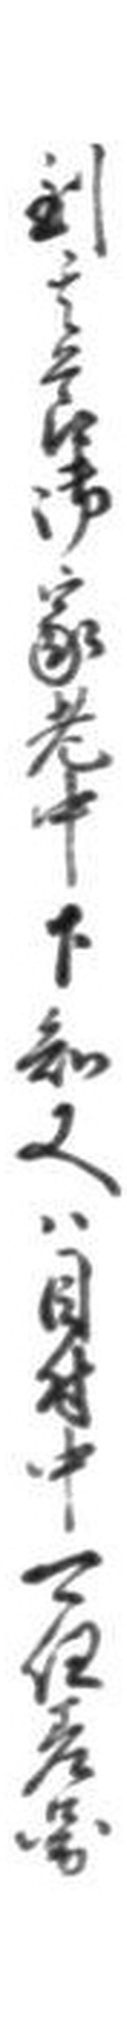到其節御家老中下知又ハ目付中可任差図
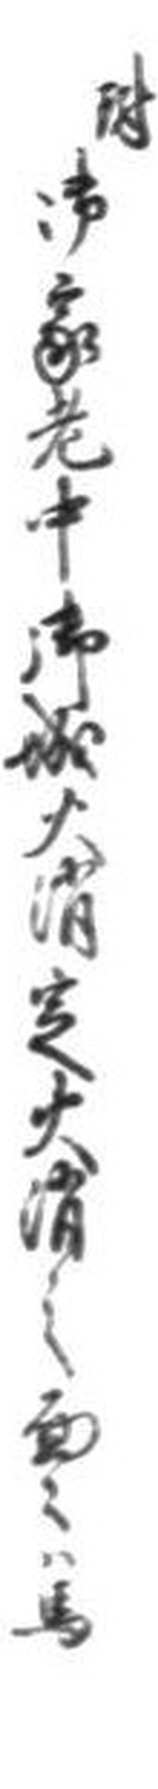御家老中御城火消定火消之面々ハ馬
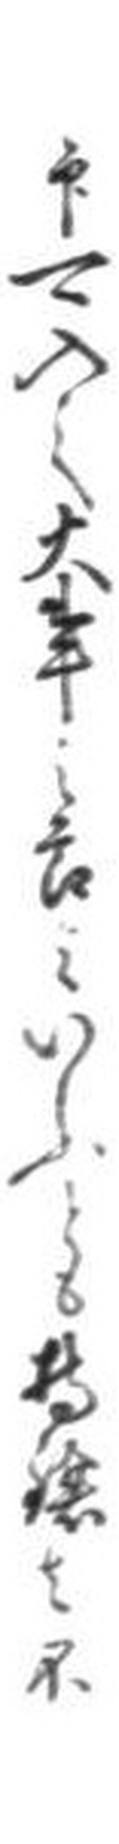印可入之大事之節与いふとも持鎗者不
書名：家譜 三十三 吉邦公 享保四年
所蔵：福井県文書館 Fukui Prefectural Archives
